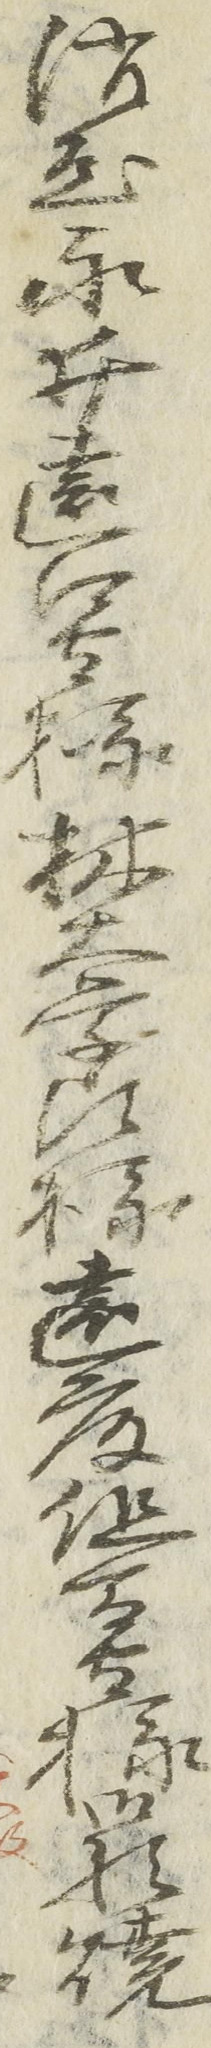消屋永井遠江守様林大学頭様遠藤但馬守様御類焼
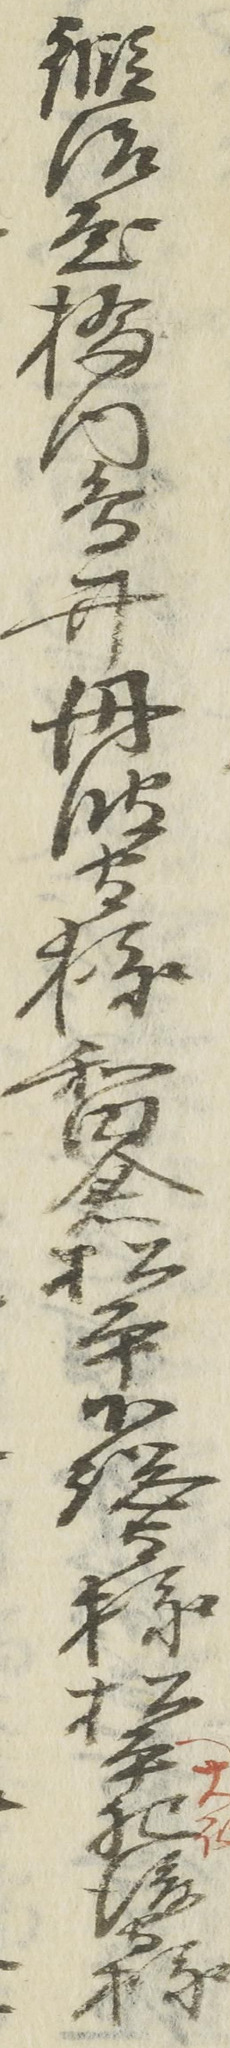鍛治屋橋内鳥井丹波守様和田倉松平下総守様松平肥後守様
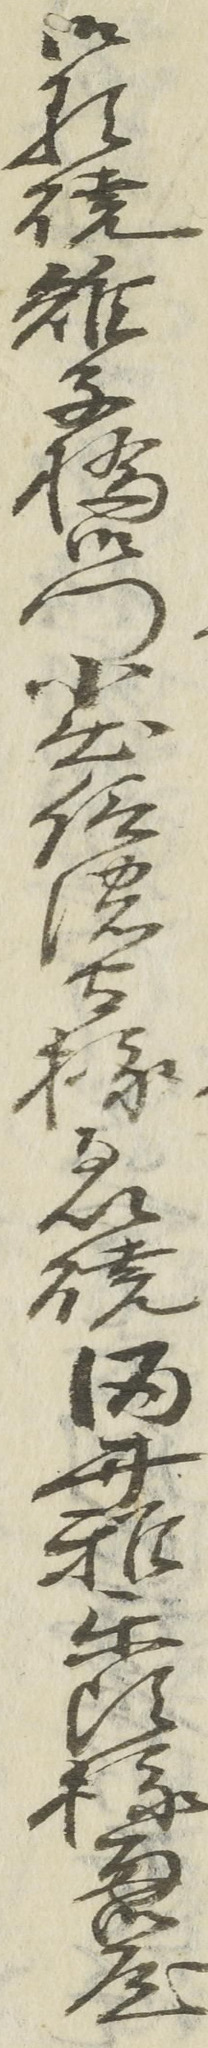御類焼雉子橋御門内小出信濃守様るい焼酒井雅楽頭様両御屋
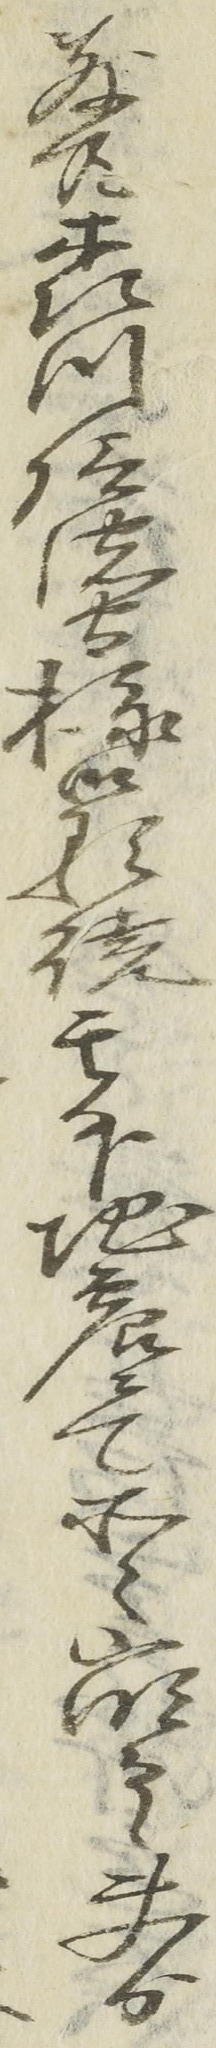敷共森川信濃守様御類焼其外地震ニて所々崩るゝ夫ゟ
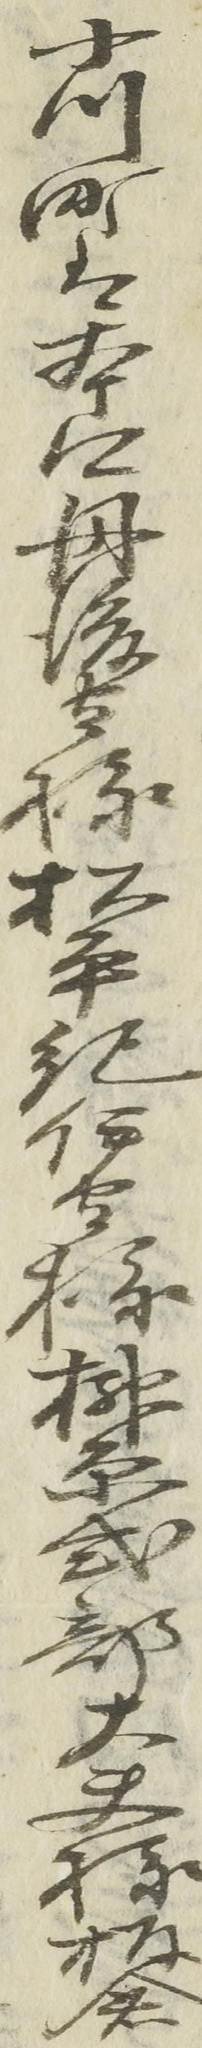小川町は本郷丹後守様松平紀伊守様榊原式部大夫様板倉
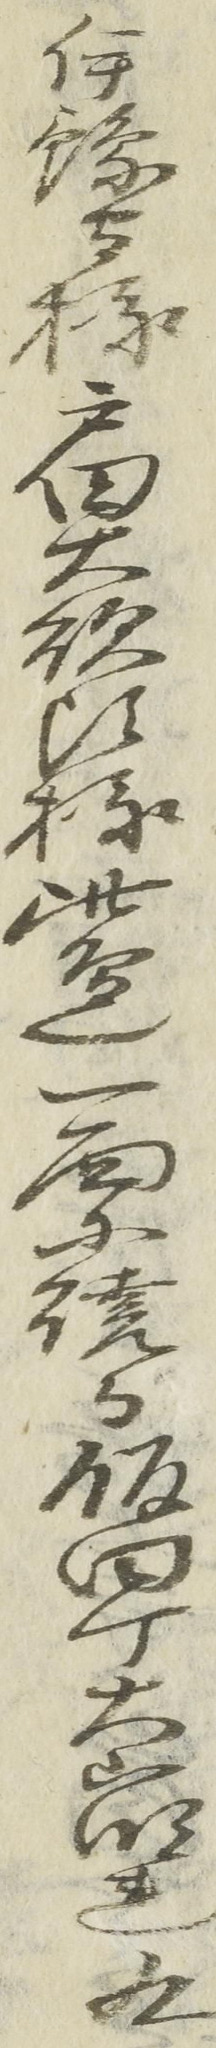伊予守様戸田大炊頭様此辺一面に焼る飯田丁大崩れ九
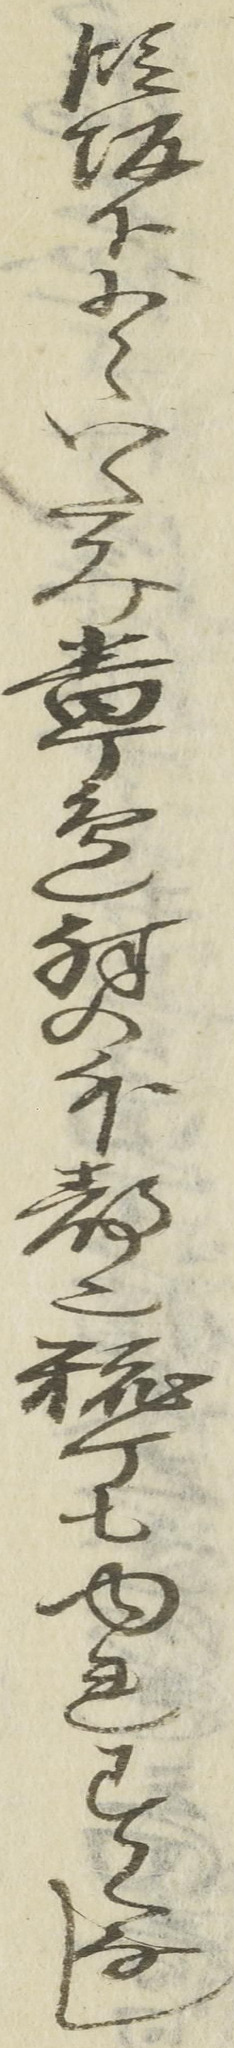段坂下少々いたみ番丁辺殊の外静也糀丁もゆれすくなし
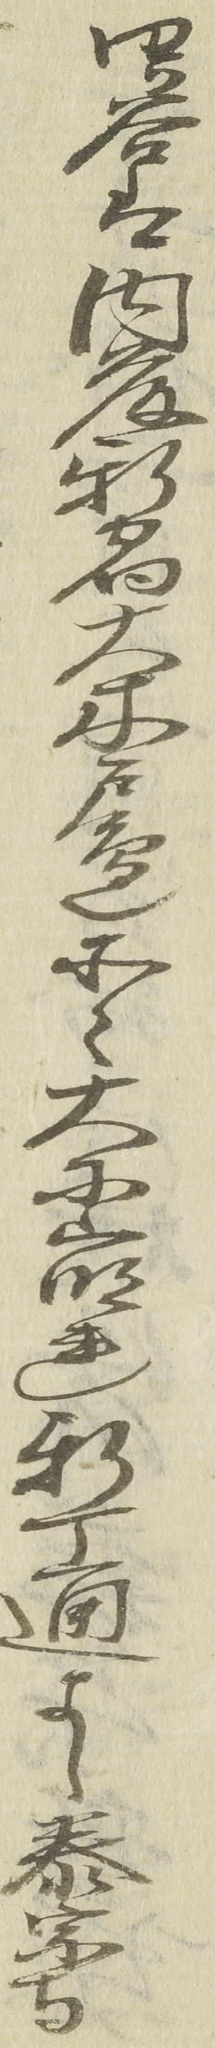四ツ谷は内藤新宿大木戸辺所々大に崩れ新丁通より泰宗寺
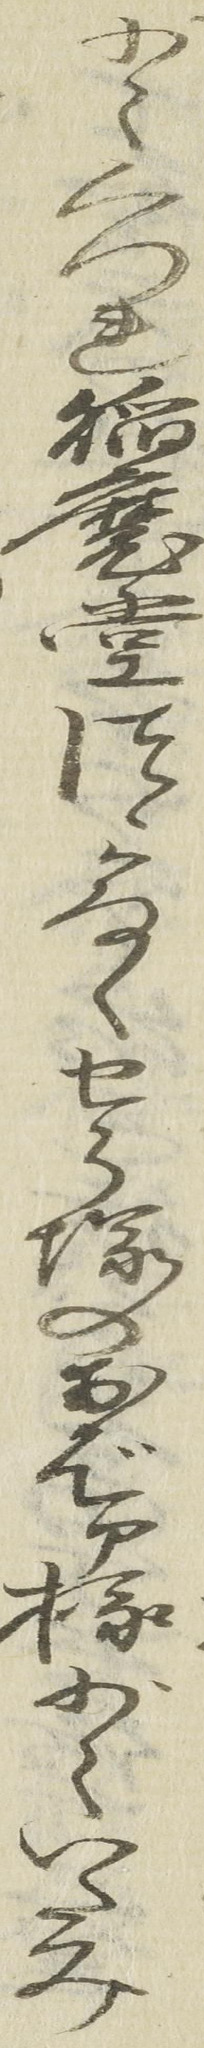少々くつれ焔魔堂つゝかなくせう塚のおばあ様少々いたみ
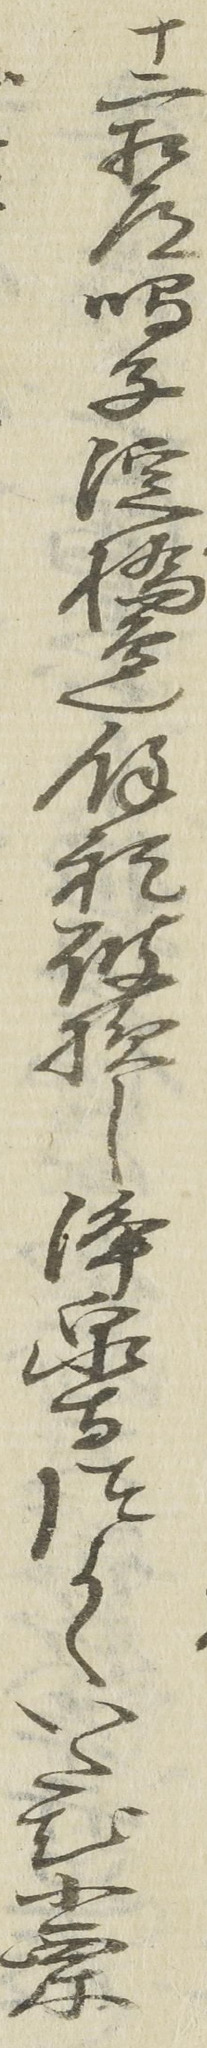十二相道鳴子淀橋辺余程破損し浄泉寺つよくいたむ小栗
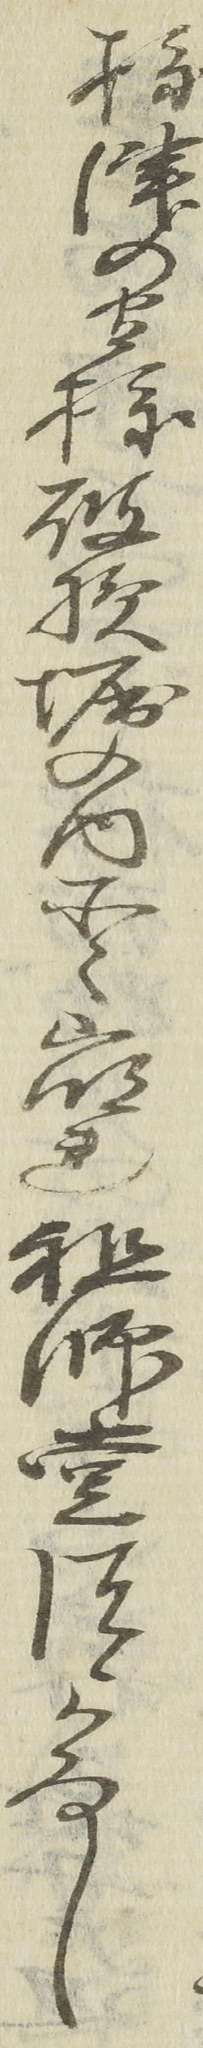摂津の守様破損堀の内所々崩れ祖師堂つゝかなし
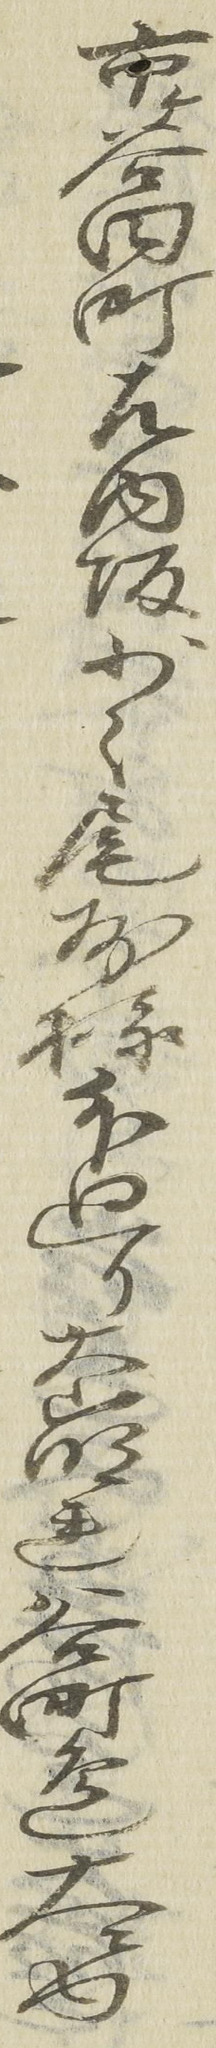市ヶ谷田町左内坂少々尾州様外廻り大崩れ谷町辺大にゆ
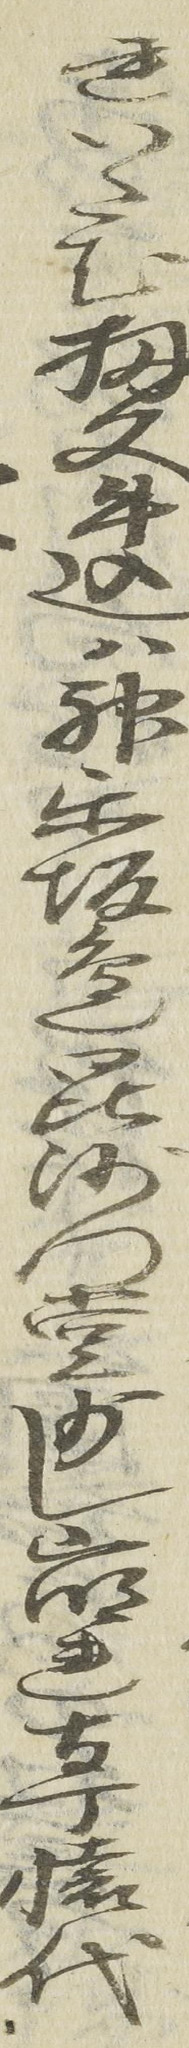れいたむ扨又牛込ハ神楽坂辺毘沙門堂少し崩れ寺丁猿代
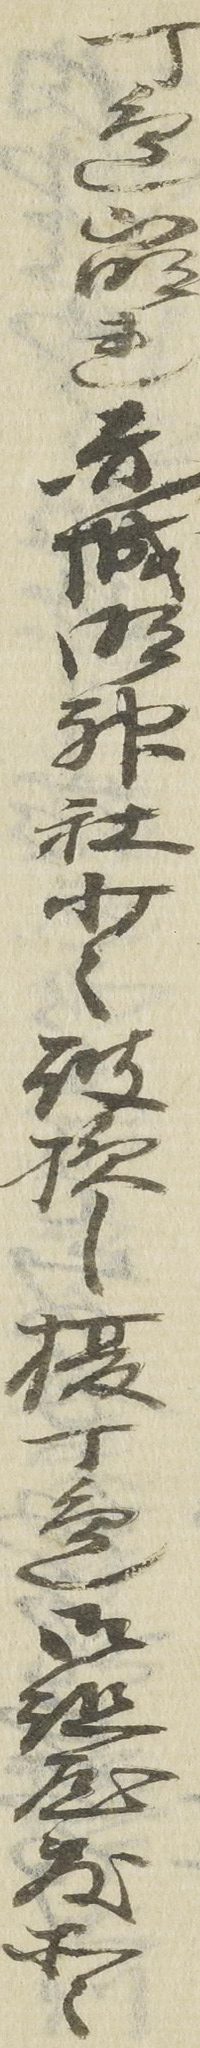丁辺崩れ赤城明神社少々破損し榎丁辺御組屋敷所々
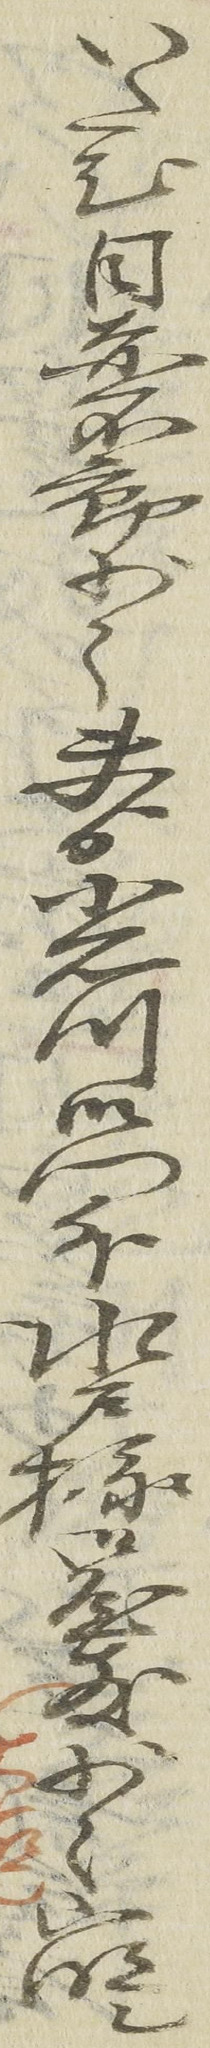いたむ目赤不動少々夫ゟ小石川御門外水戸様御屋敷少し崩レ
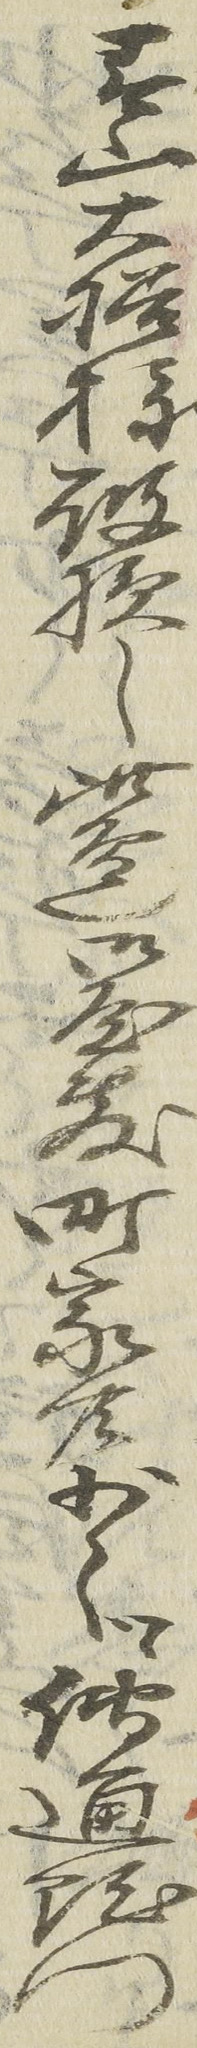青山大膳様破損し此辺御屋敷町家共少々つゝ伝通院門
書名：安政乙卯江戸大地震筆記　安政丙辰八月大阪大雷雨之記追加　安政三辰年七月松前辺大地震并八月大風雨記録
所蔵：東京大学地震研究所図書室 Earthquake Research Institute Library, The University of Tokyo, JAPAN
